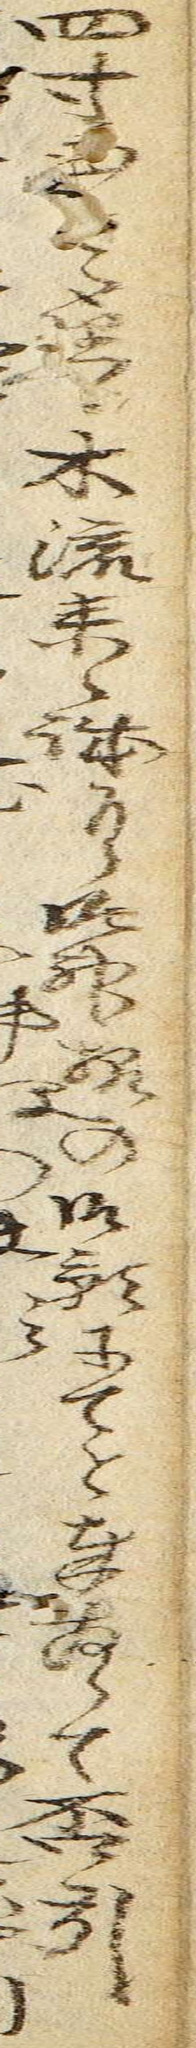四寸ほと御座候木流来候誠に御神様の御影にてと奉存候て否引
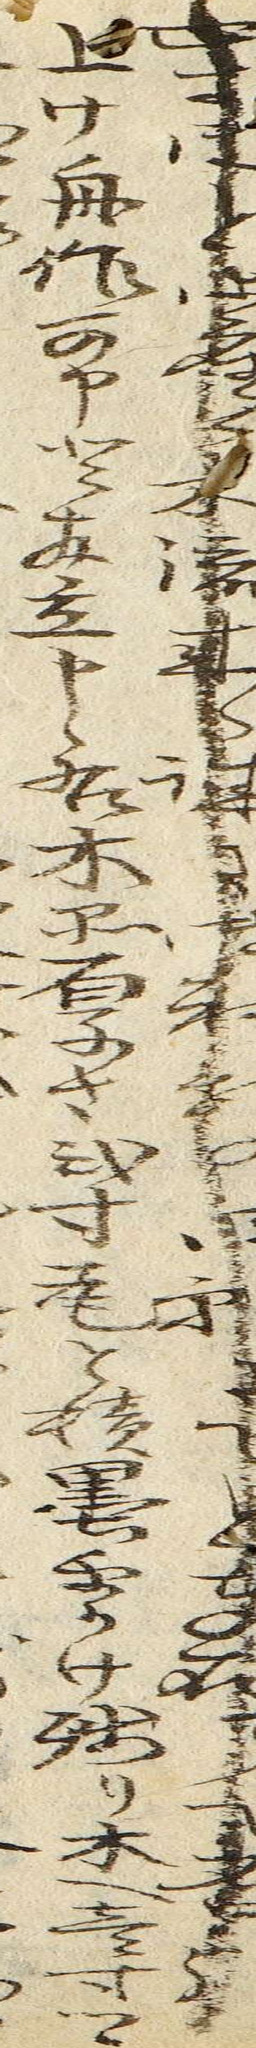上け舟作可申と存立申候右木品厚さ弐寸尾と積墨をかけ残り木へ壱寸ツヽ
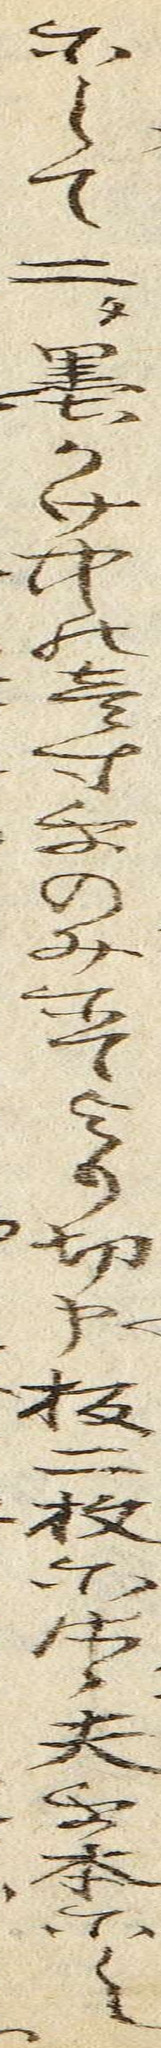にして二タ墨かけ中の壱寸をのみにてより切申板二枚に仕候夫を本にし
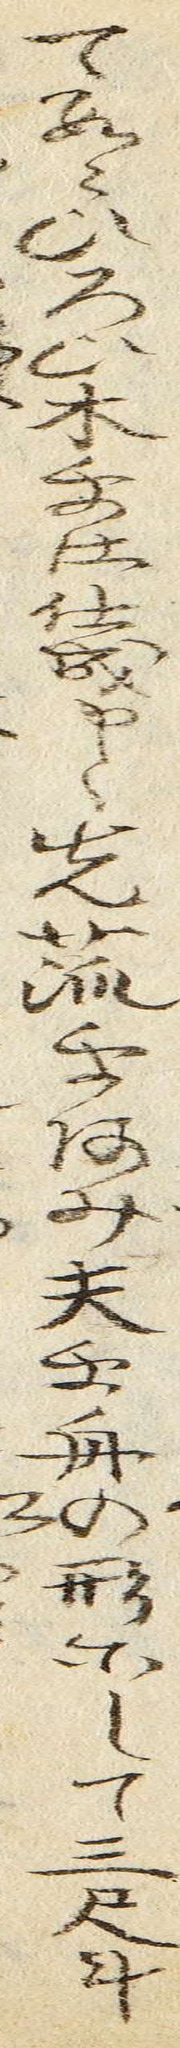て段々ひろひ木を仕仕成申候先菰をあみ夫を舟の形にして三尺計
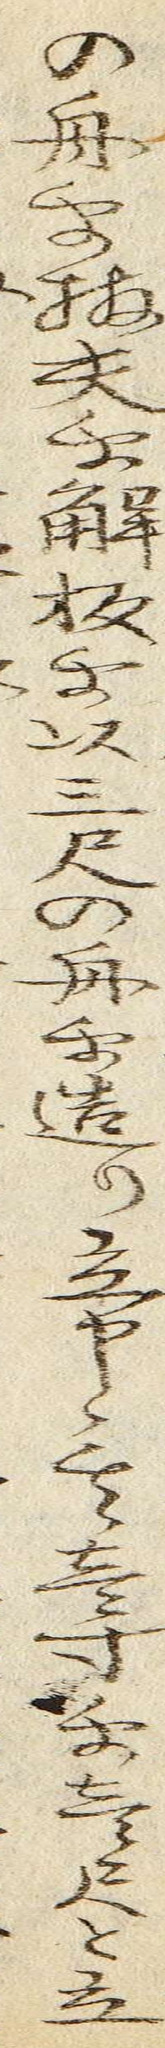の舟を拵夫を解板を以三尺の舟を造り立申候其壱寸を壱尺と立
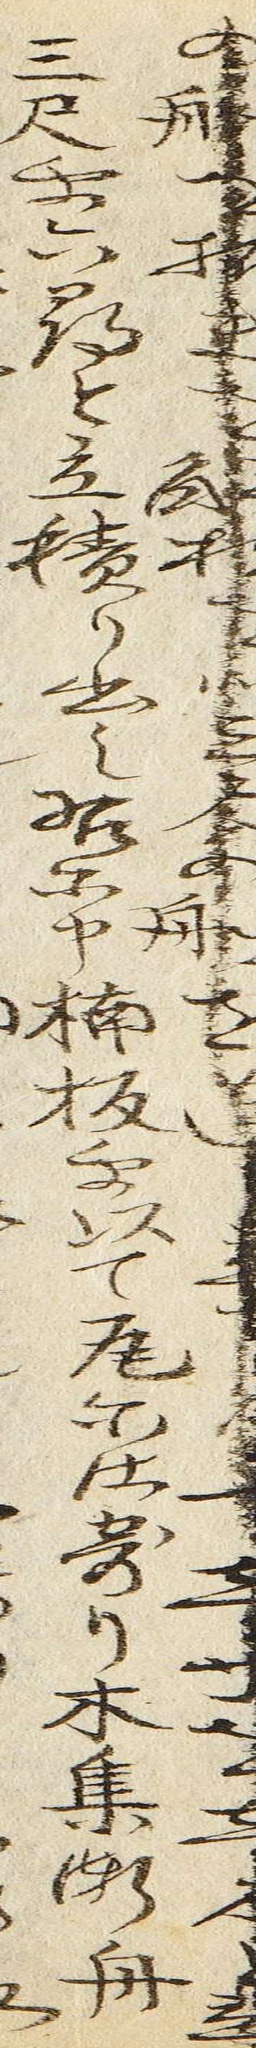三尺を六尋と立積り出し右に申楠板を以て尾に仕寄り木集漸舟
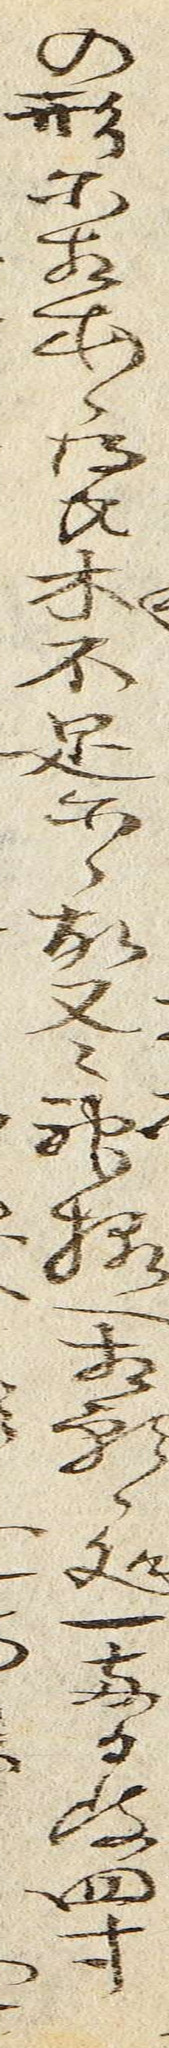の形に相成候得共木不足に候故又々神様へ相願候処一両日致四寸
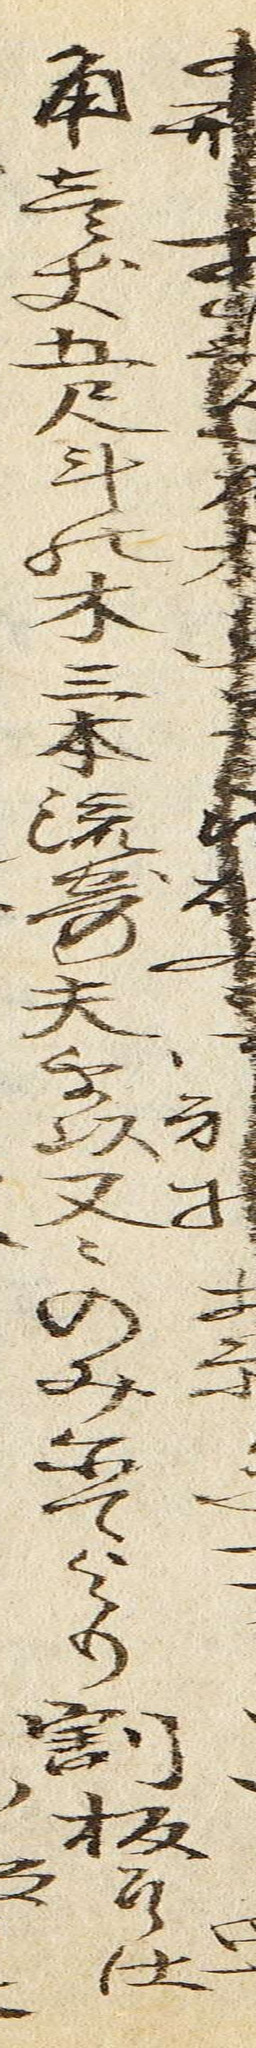角壱丈五尺計の木三本流寄夫を以又々のみにてより割板に仕
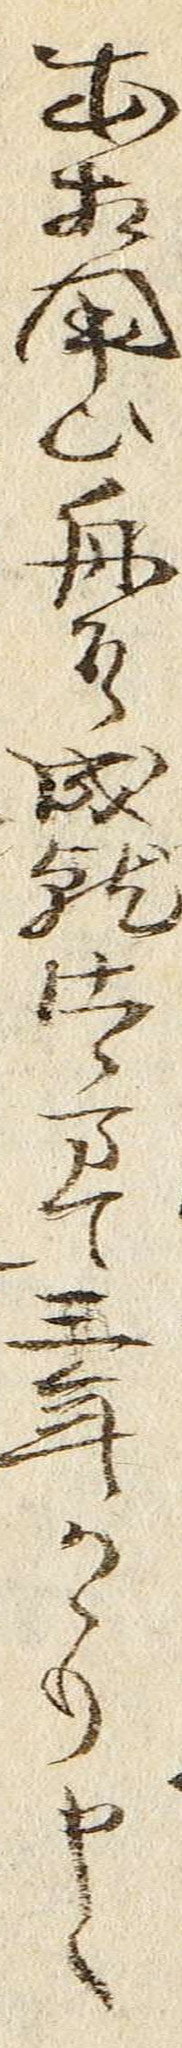成相用ひ舟に成就仕候まて三年かゝり申候
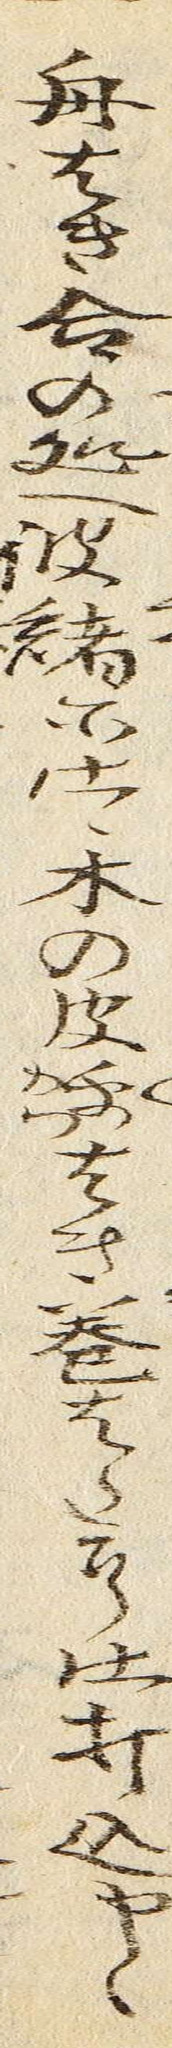一舟はき合の処へ彼緒に仕候木の皮をはき巻はたに仕打込申候
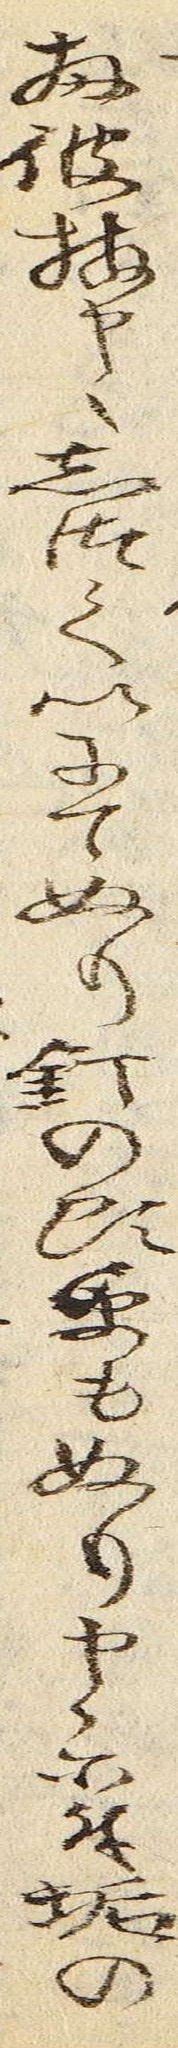扨彼拵申候しつくいにてぬり釘の頭をもぬり申候に付垢の
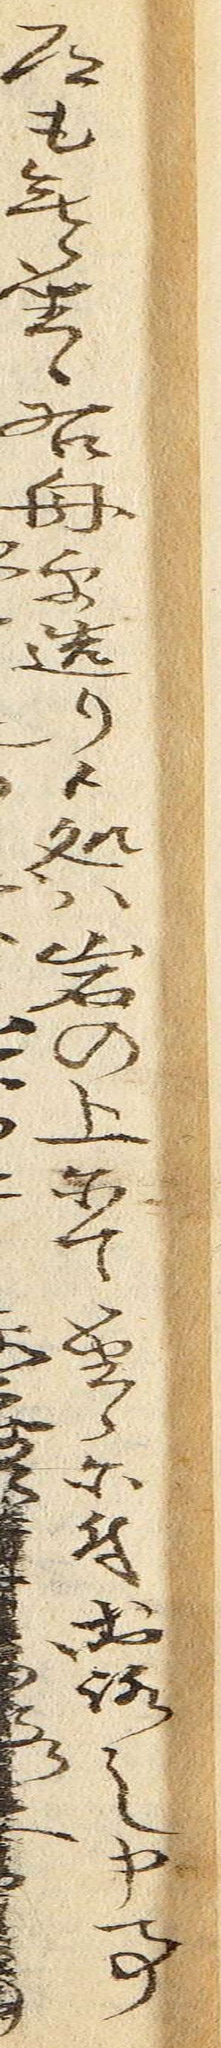道も無御座候右舟を造り候処ハ岩の上にて御座候に付おろし申事
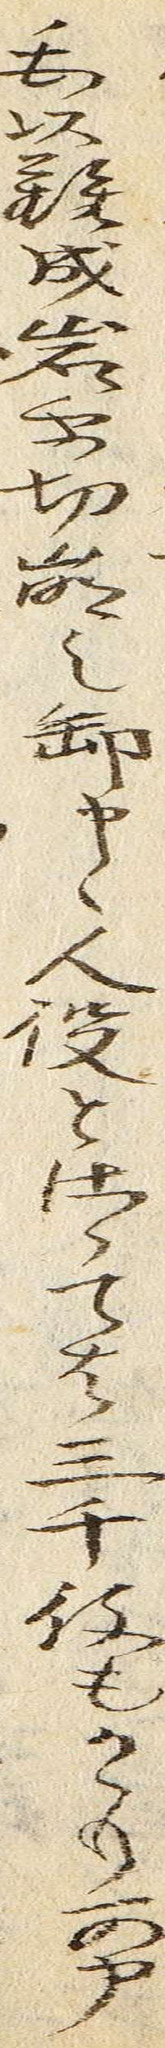甚以難成岩を切崩し卸申候人役と仕候ては三千役もかゝり可申
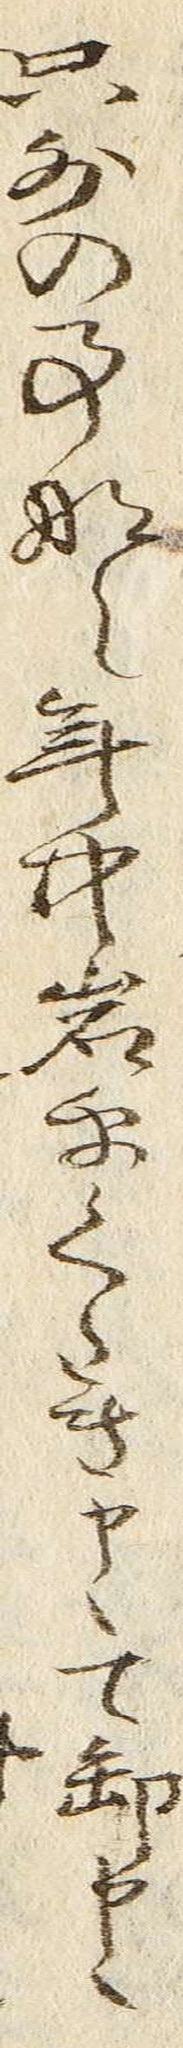只外の事なし年中岩をくたき申候て卸申候
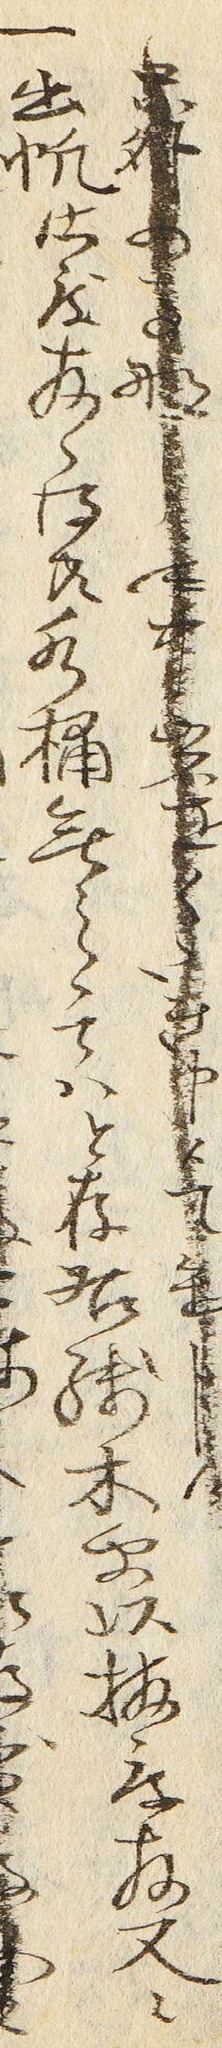一出帆仕度存候得共水桶無之候てハと存右残木を以拵度存又々
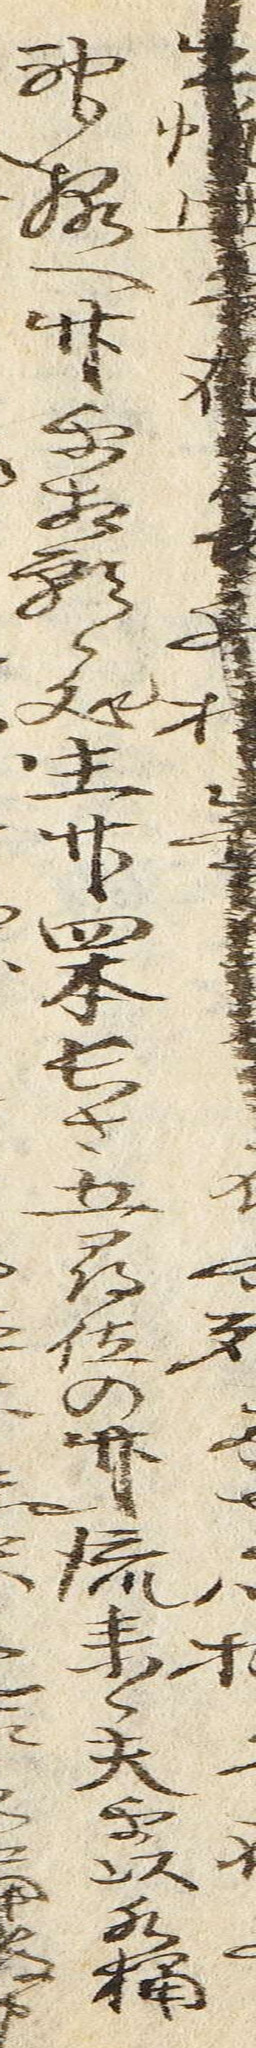神様へ竹を相願候処生竹四本長さ五尋位の竹流来候夫を以水桶
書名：無人島漂流書付
